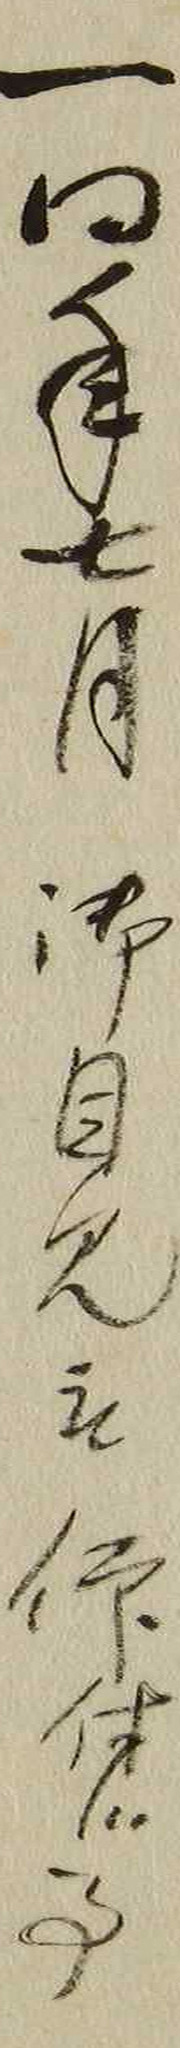一同年七月御目見被仰付候事
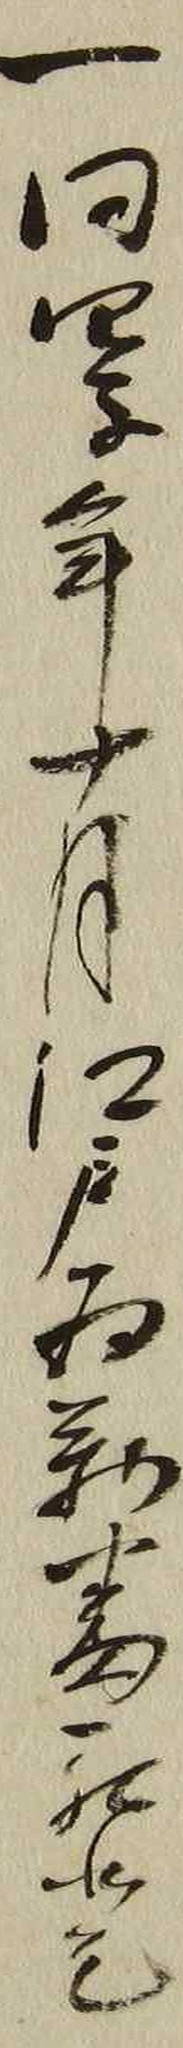一同四子年十月江戸為勤番罷登
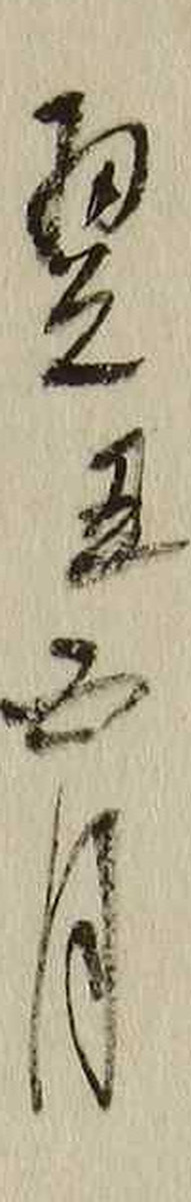翌丑五月
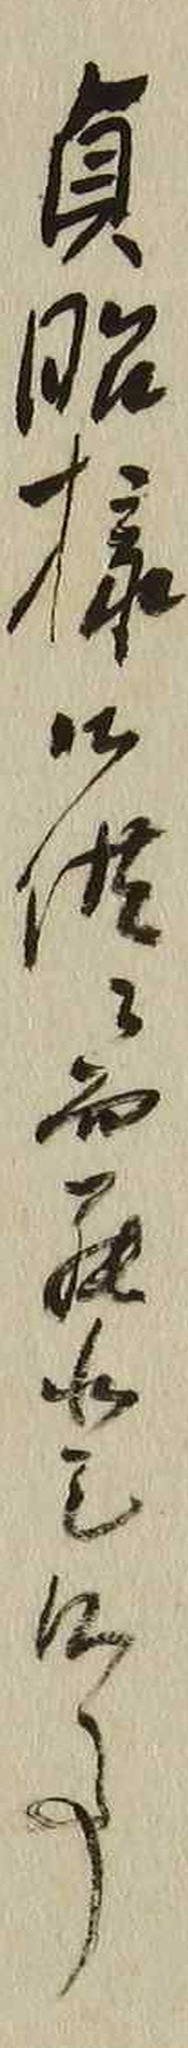貞照様御供ニ而罷登候事
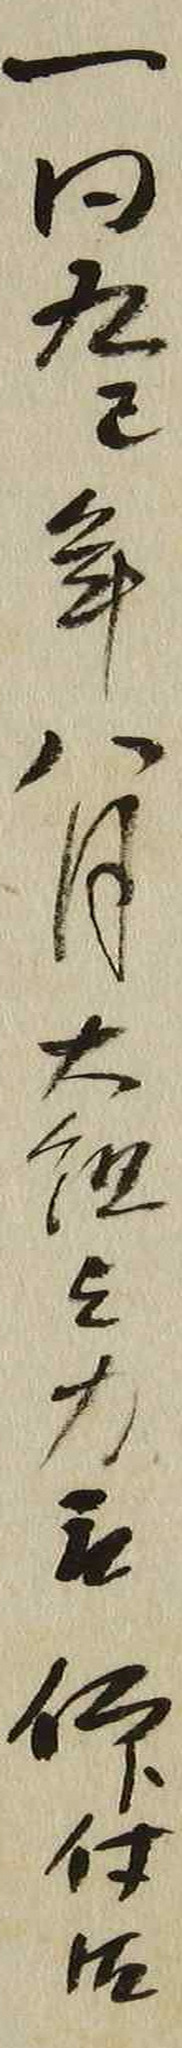一同九巳年八月大組与力被仰付御
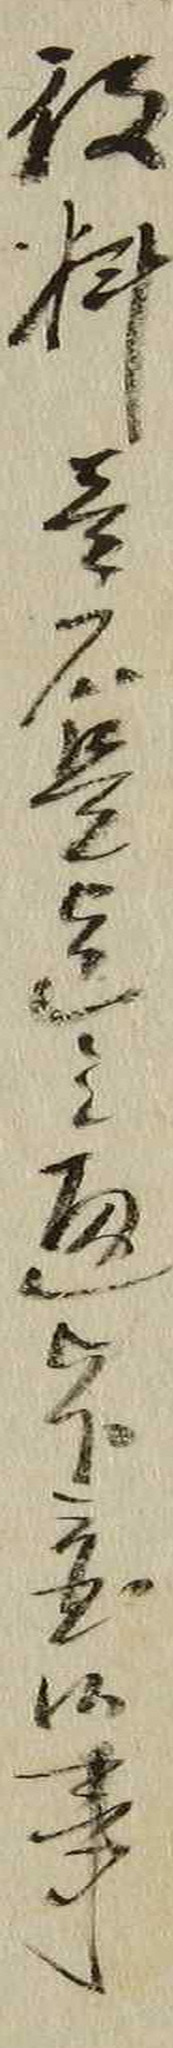役料壱石是迄之通被下置候事
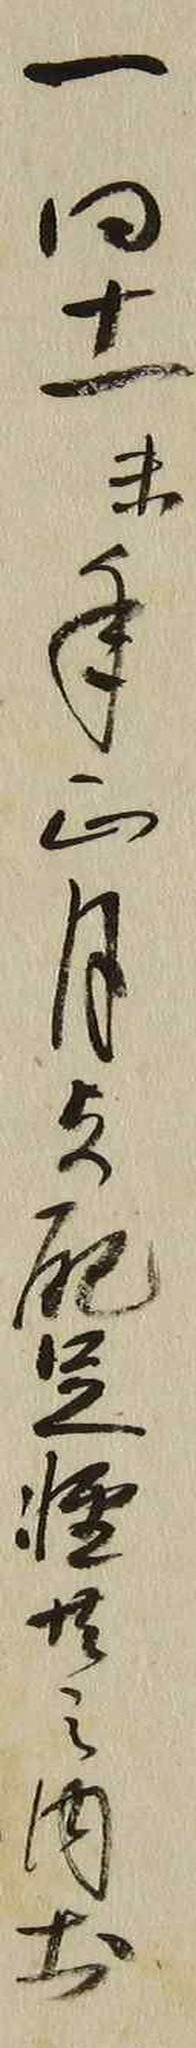一同十一未年正月支配足軽共之内於
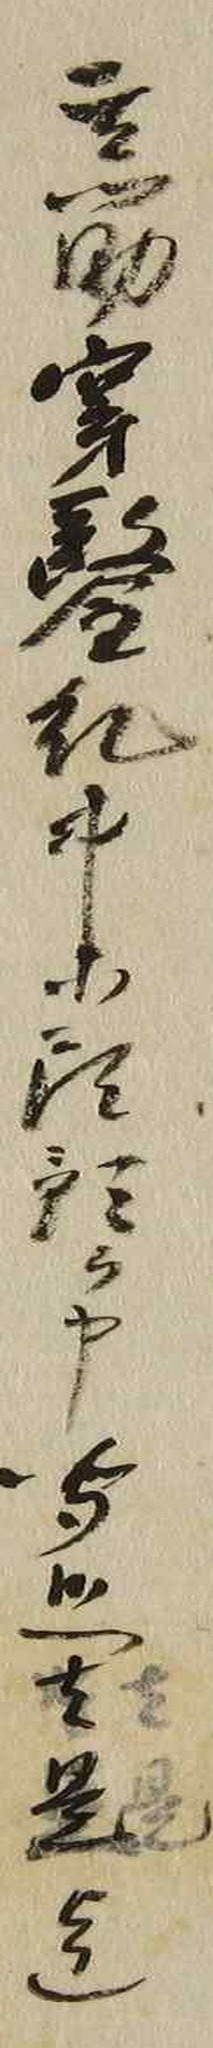其筋穿鑿糺中小頭預り申聞候へは是迄
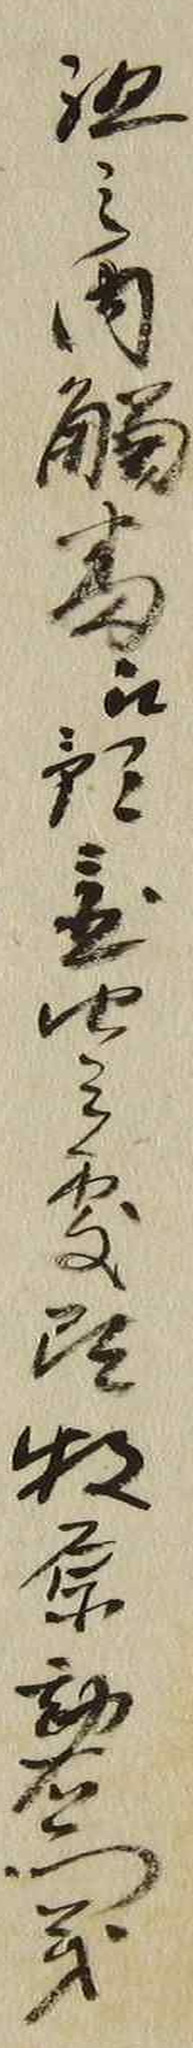組之内触番江預置由之処頭牧原勘右衛門義
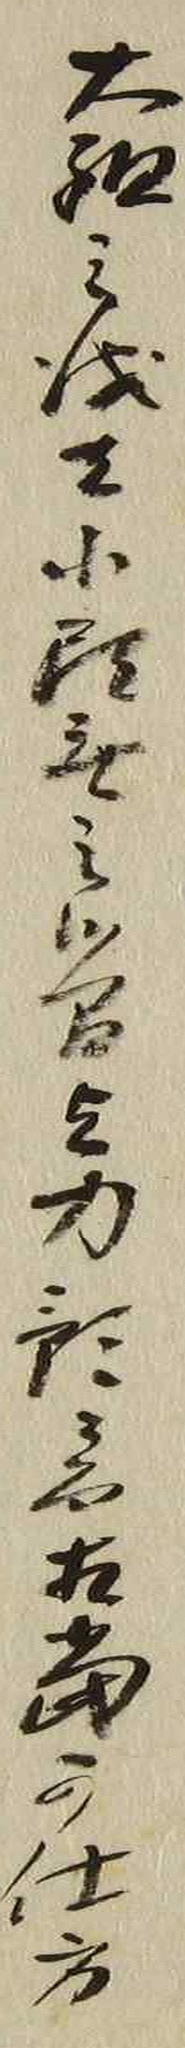大組之儀は小頭無之候間与力預ニ而相当可仕方
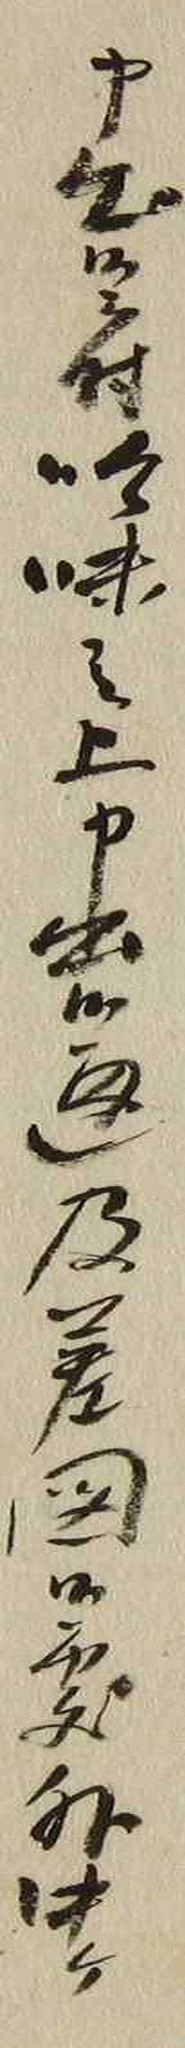申乞候ニ付吟味之上申出候通及差図候処外仲ヶ
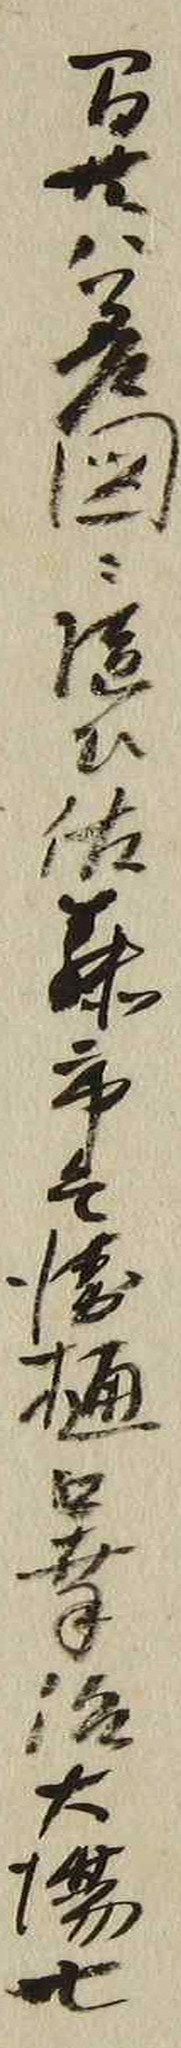間共ハ指図ニ随ひ佐藤市兵衛樋口幸治大場七
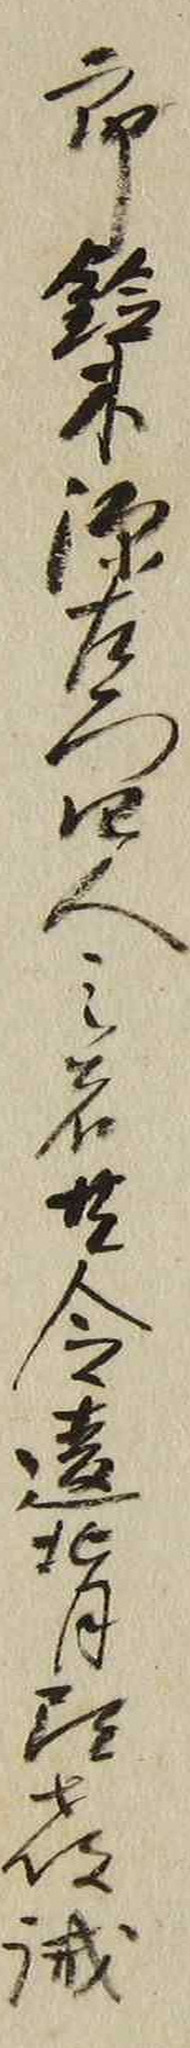郎鈴木源左衛門四人之者共令違背頭教誡
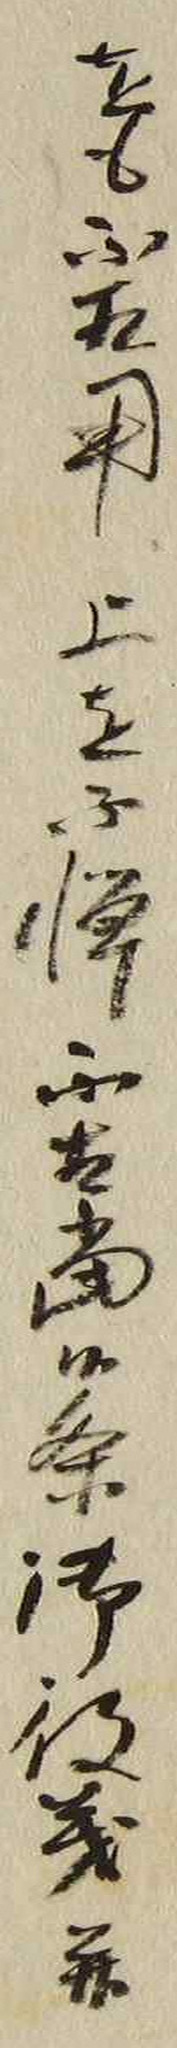をも不相用上を不憚不相当候条御役義并
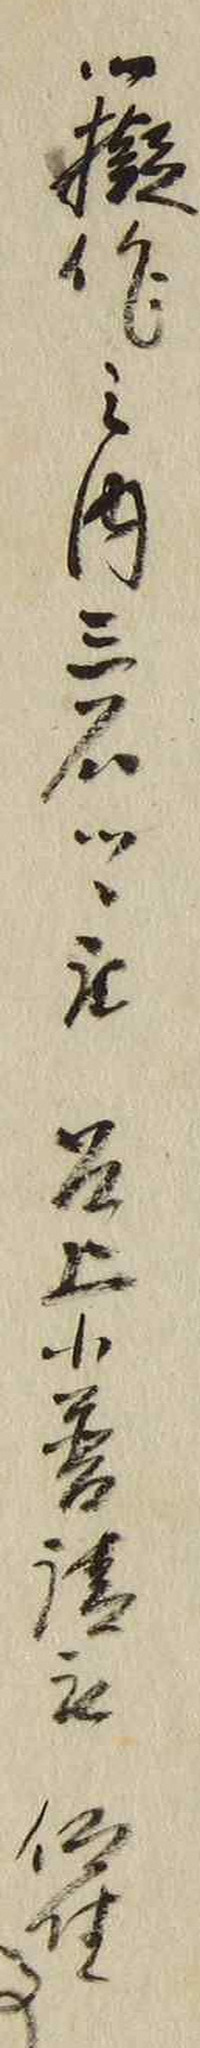御擬作之内三石ツゝ被召上小普請被仰付候事
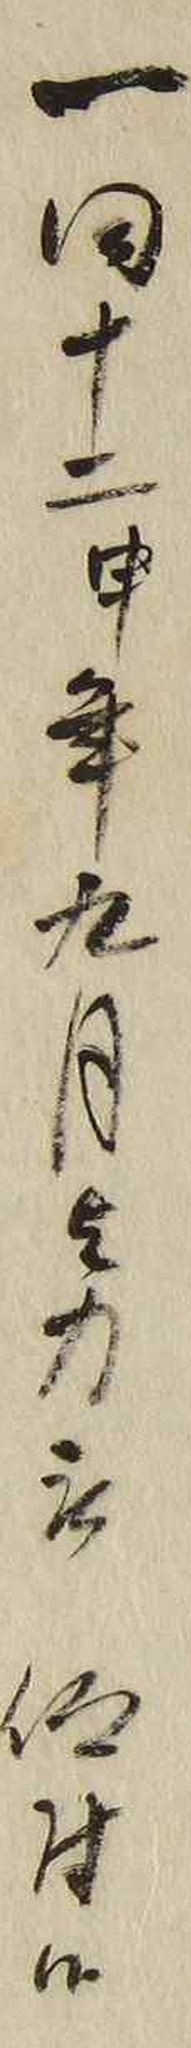一同十二申年九月与力被仰付候
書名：諸士系譜　巻之360　す之部10
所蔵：会津若松市立会津図書館
